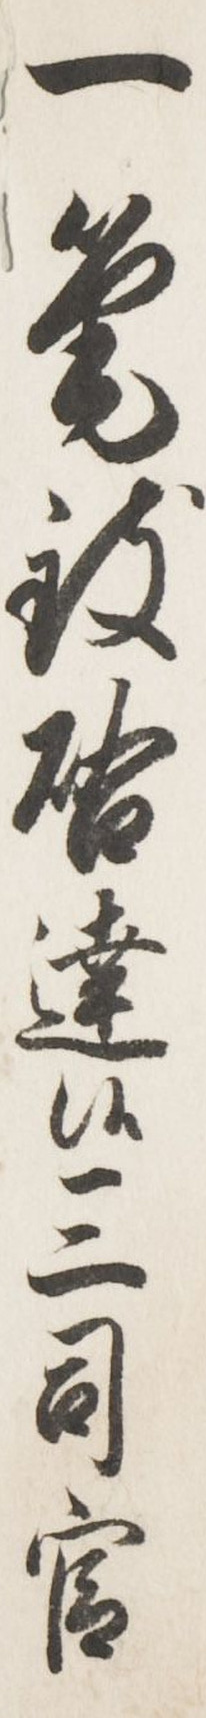一筆致啓達候三司官
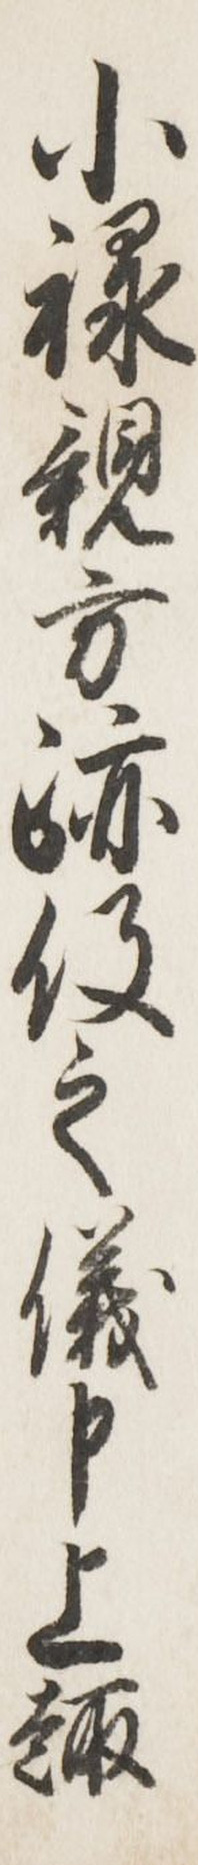小禄親方跡役之儀申上趣
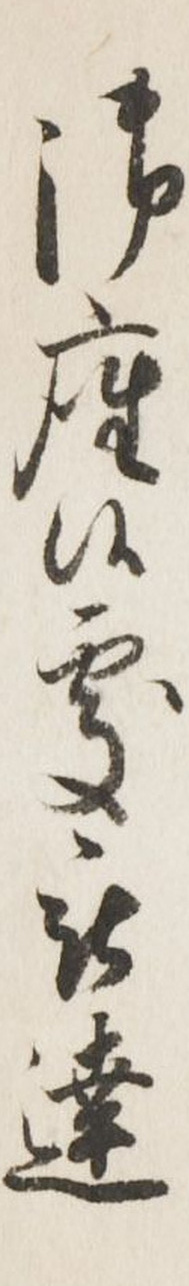御座候処被達
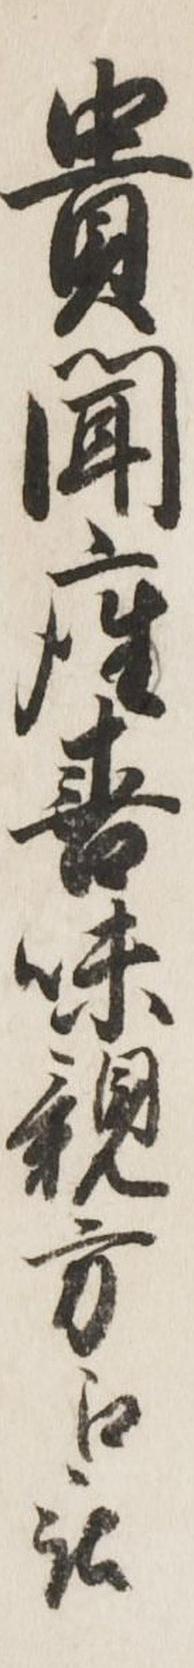貴聞座喜味親方江被
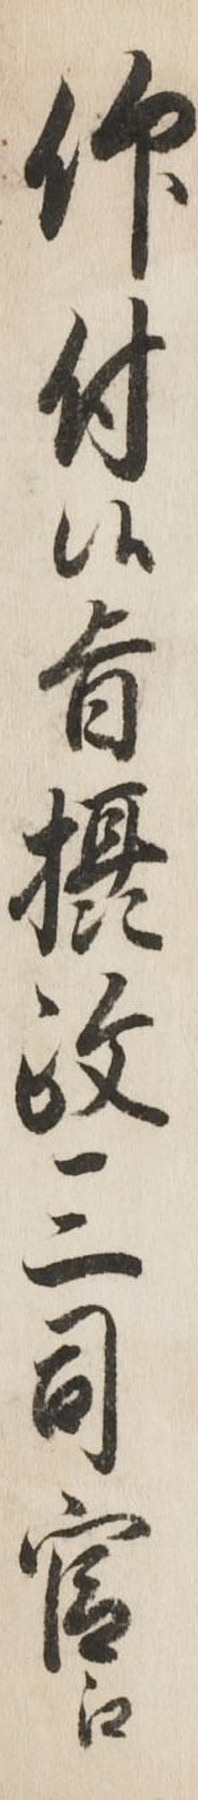仰付候旨摂政三司官江
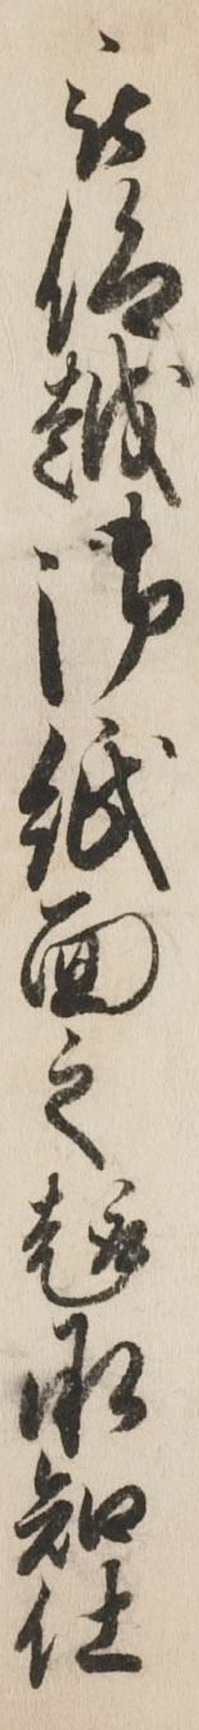被仰越御紙面之趣承知仕
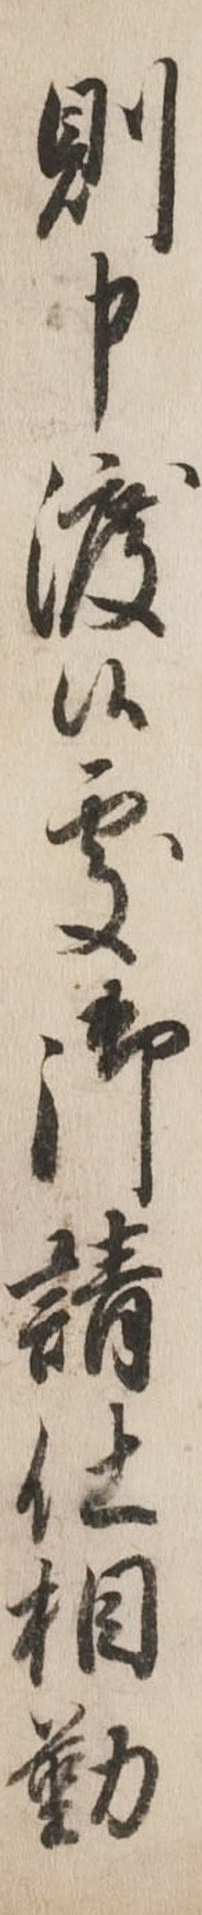則申渡候処御請仕相勤
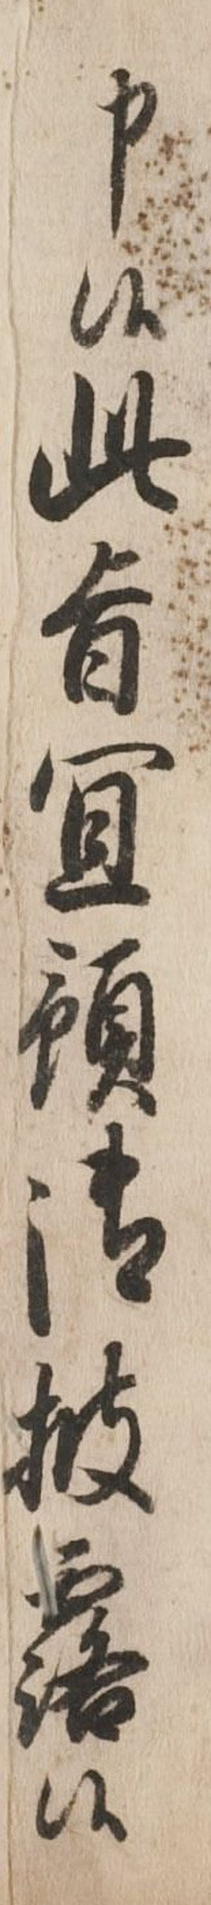申候此旨宜預御披露候
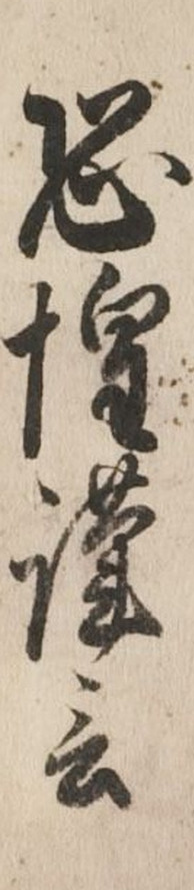恐惶謹言
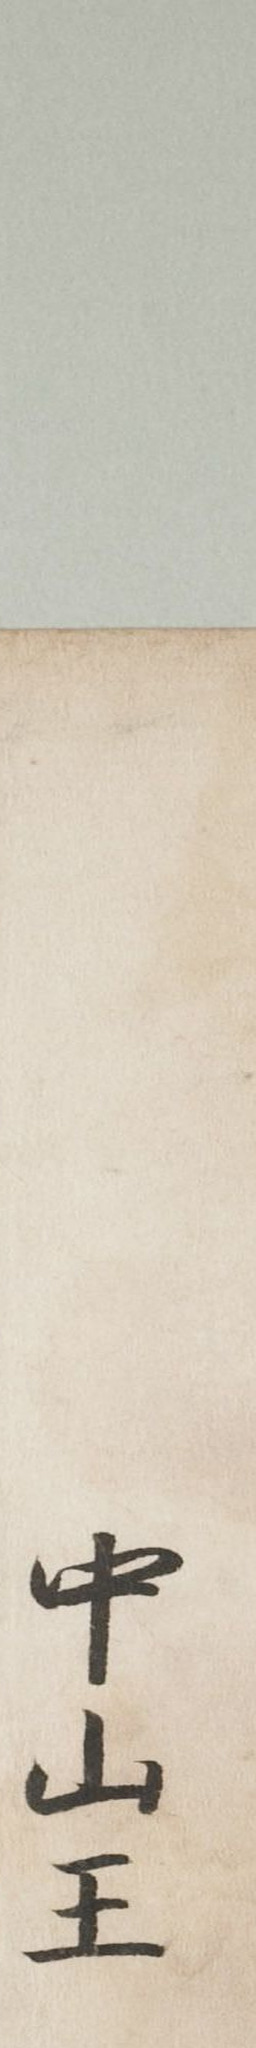中山王
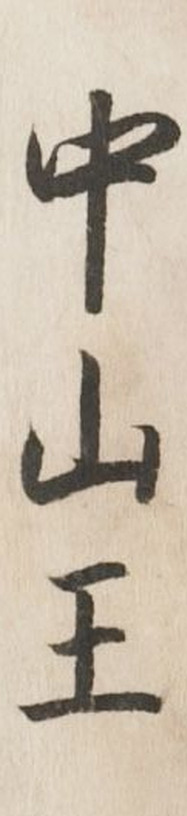中山王
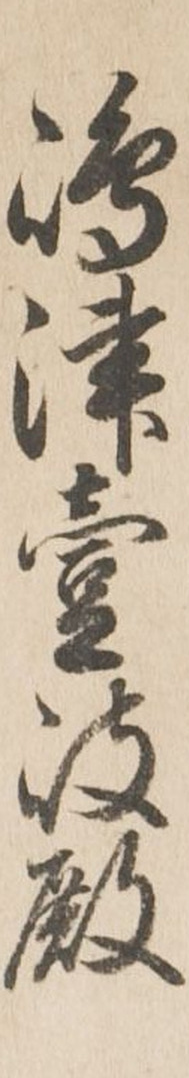嶋津壱岐殿
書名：琉球王府花押印状 中山王（尚育） 四月六日
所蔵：University of the Ryukyus Library
